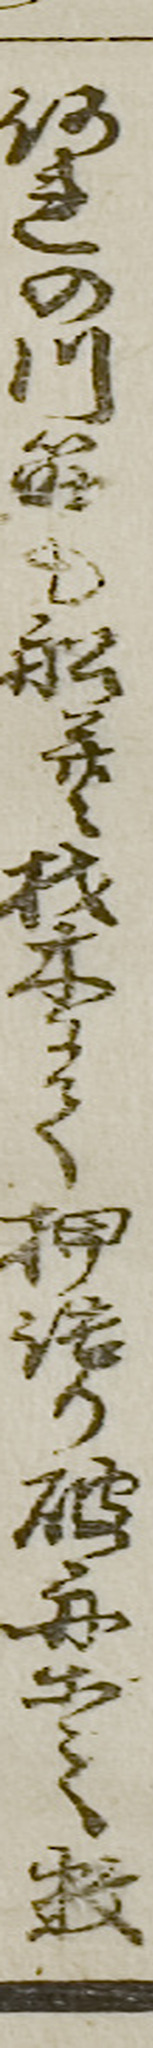何れの川筋も船幷に材木にて押詰り破舟等の数
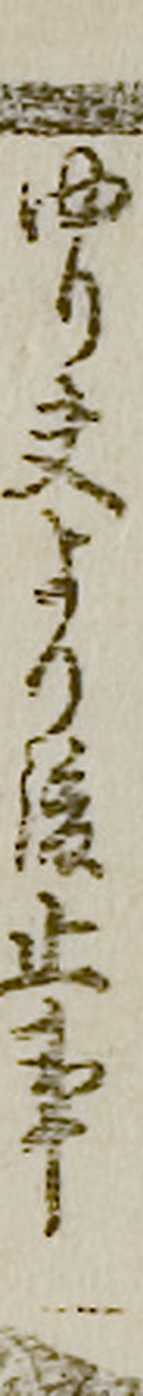ゆり夫より後止事
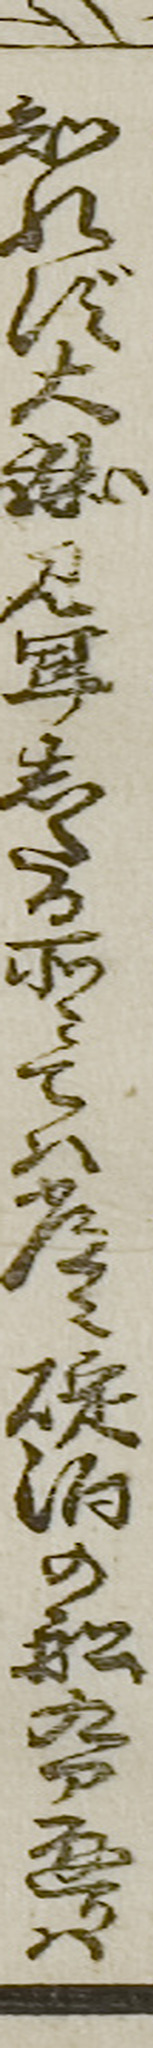知れず大体見聞したる所にては常に碇泊の船九分通りは
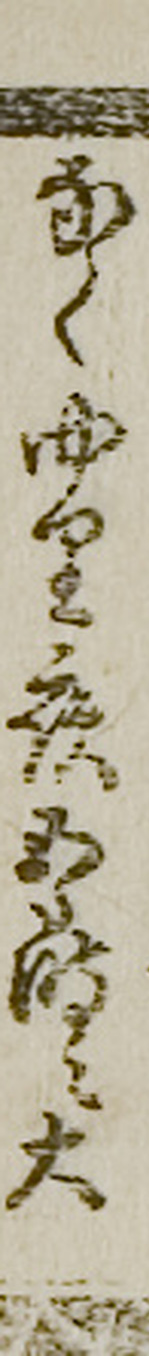なくゆり夜五つ時に大
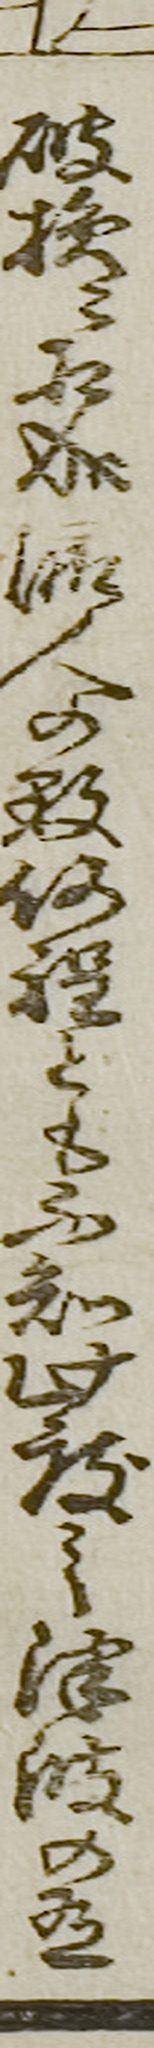破損に相成流人の数何程とも不知此度の津波の有
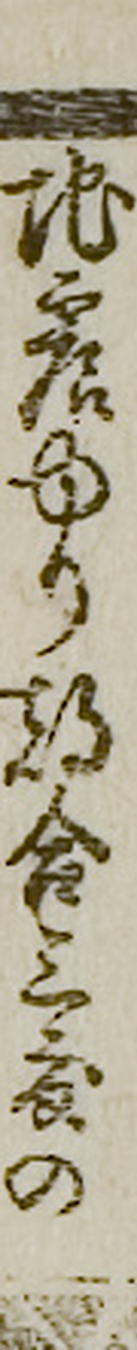地震ゆり都合三度の
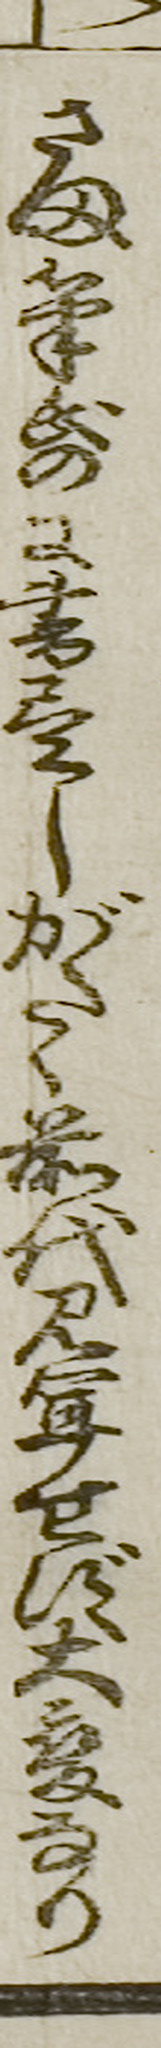さま筆紙に書尽しがたく前代見聞せず大変なり
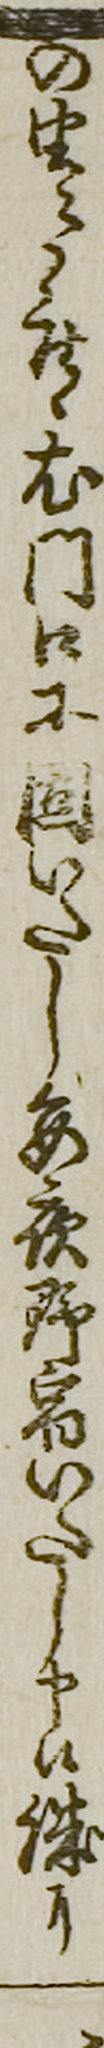の由に御座候尤門口に固いたし毎夜野宿いたし申候誠に
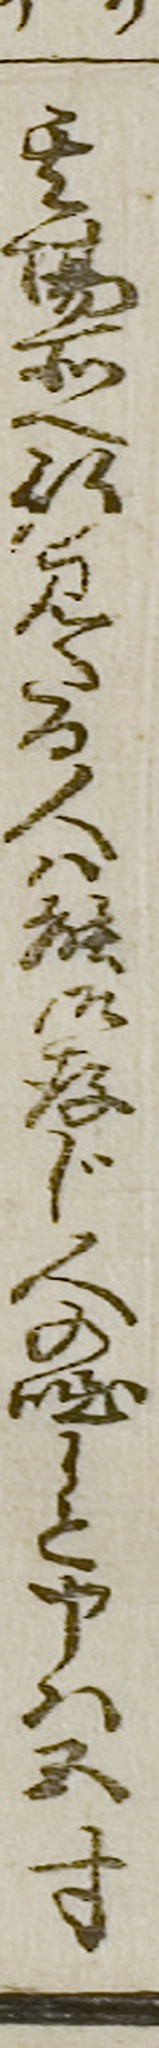其場所へ行見たる人は能御存じ人の咄しと申すは五寸
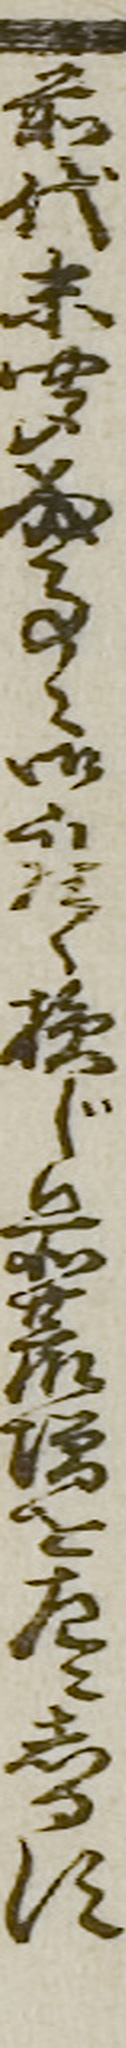前代未聞成事に御座候損じ候所荒増を左にしるす
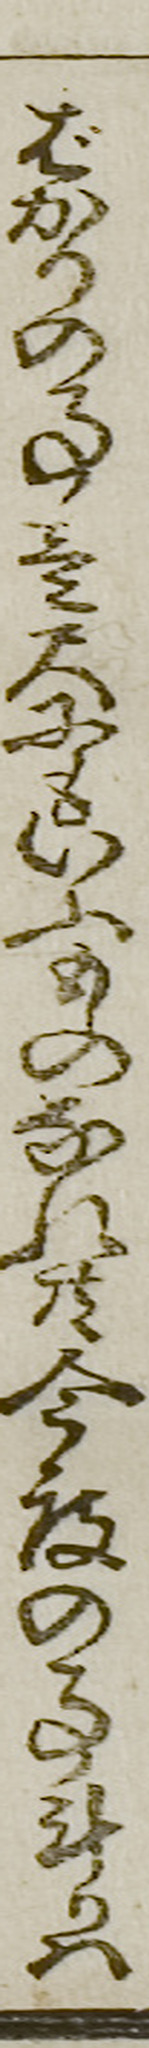ばかりの事一尺にもいふものなれ共今度の事斗りは
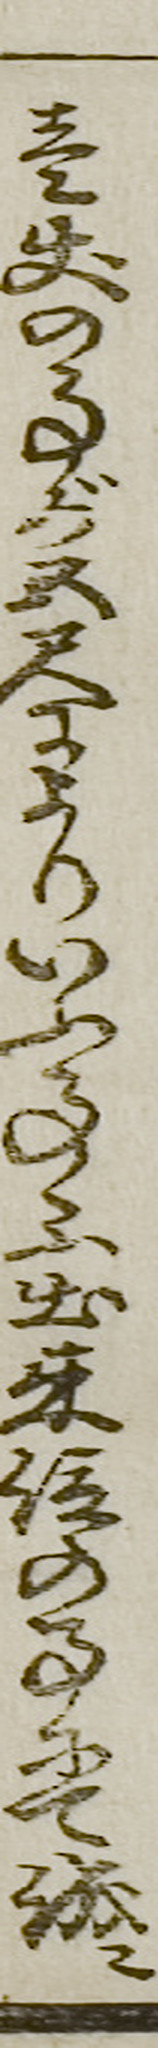壱丈の事が五尺によりいふ事不出来位の事にて誠に
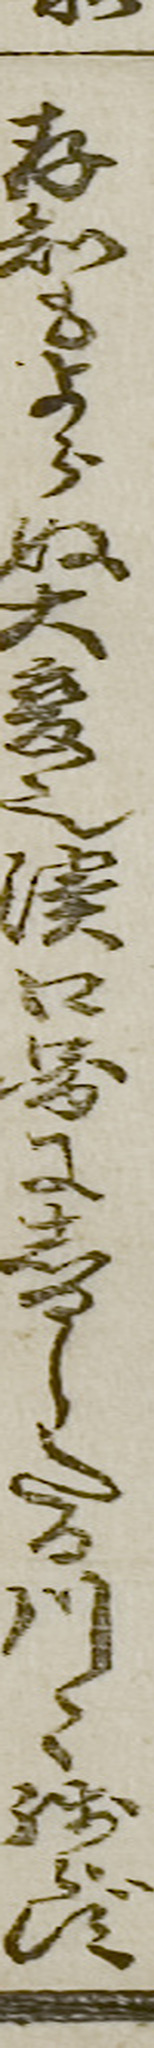存知もよらぬ大変也湊口図にしるしたる川々残らず
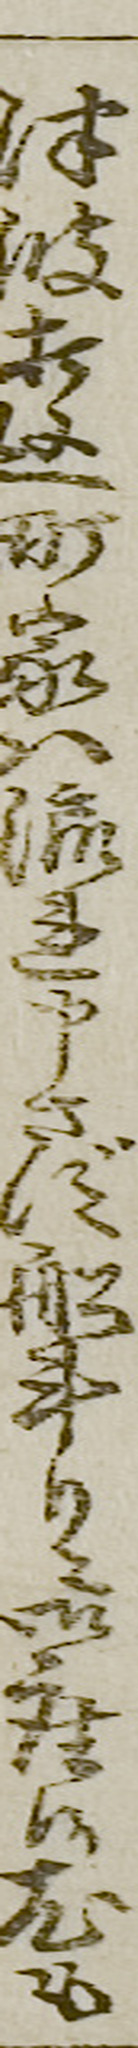津波打込町家は流れ申さず船斗りに御座候尤も
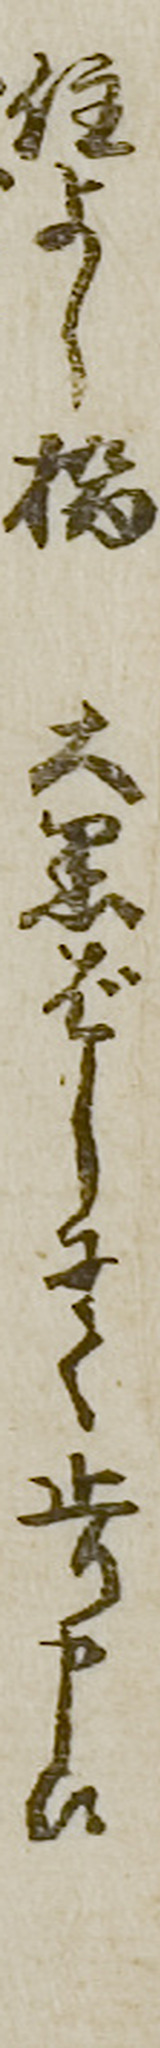住よし橋大黒ばしにて止り申候
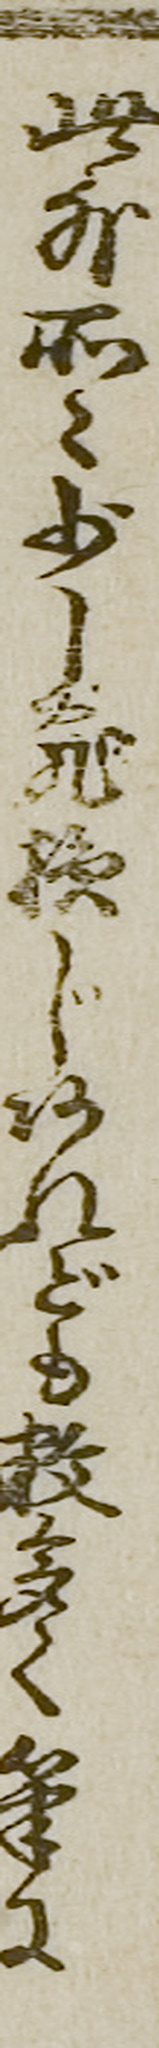此外所々少し損じあれども数多く筆に
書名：東海道大阪辺大地震津波図
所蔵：東京大学総合図書館 General Library in the University of Tokyo, JAPAN
